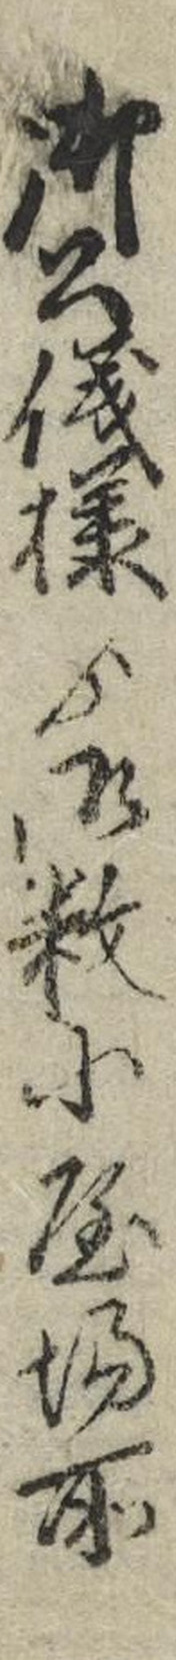御公儀様ゟ御救小屋場所
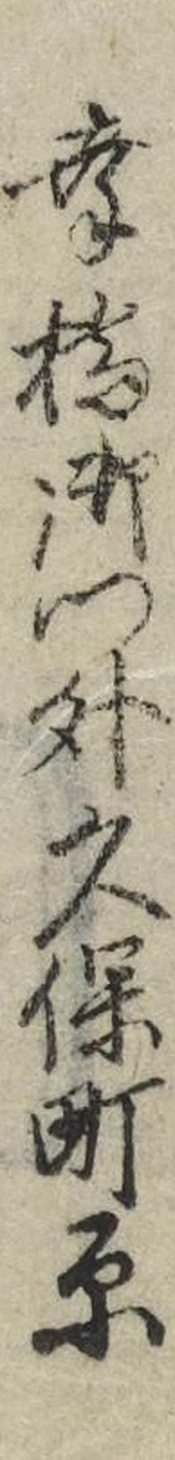幸橋御門外久保町原
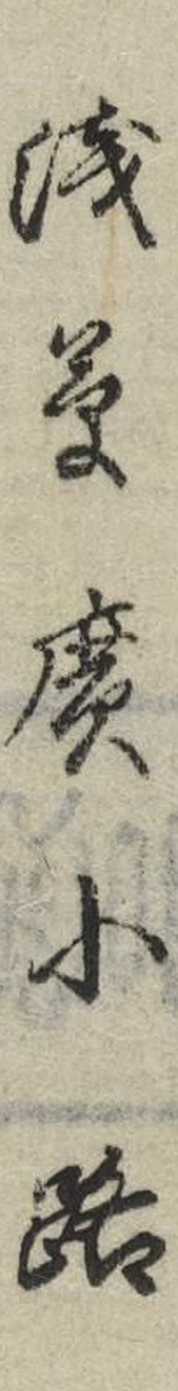浅草広小路
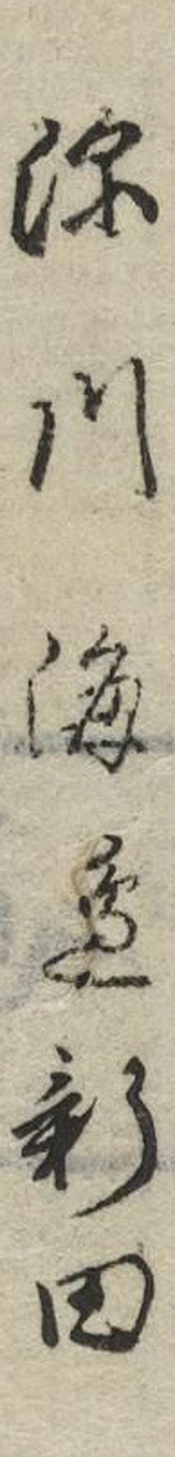深川海辺新田
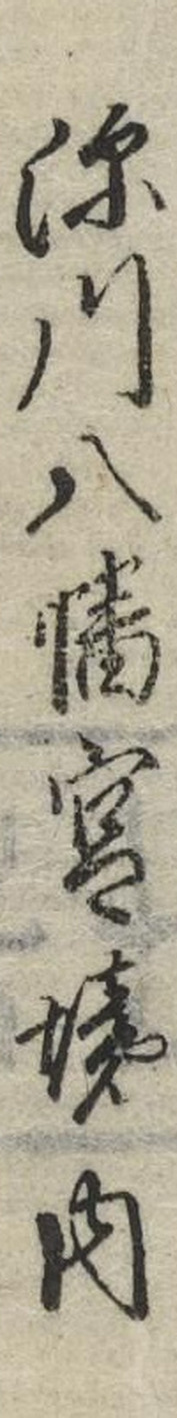深川八幡宮境内
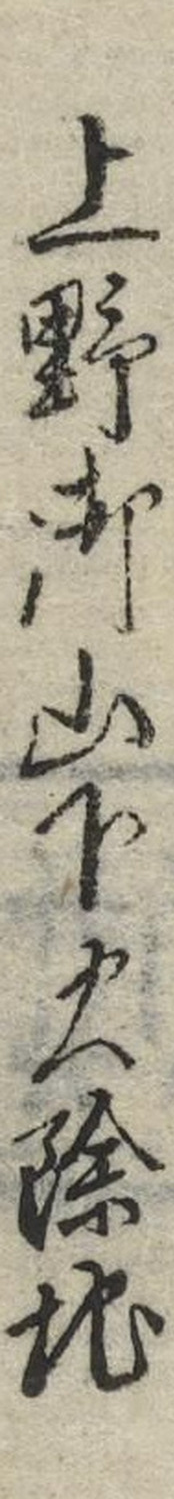上野御山下火除地
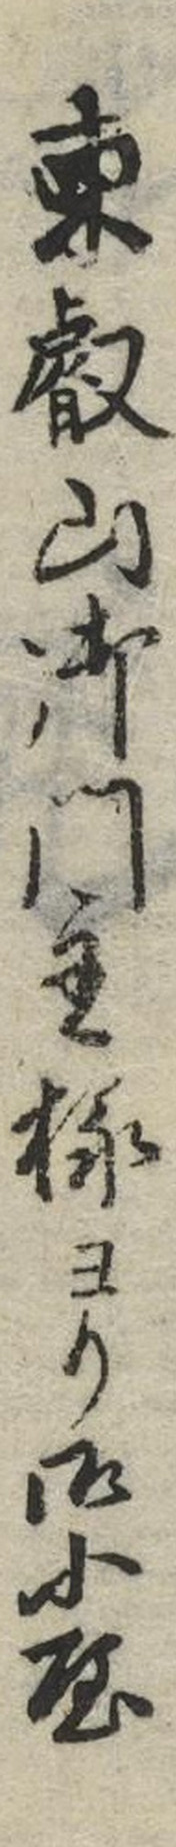東叡山御門主様ヨり御小屋
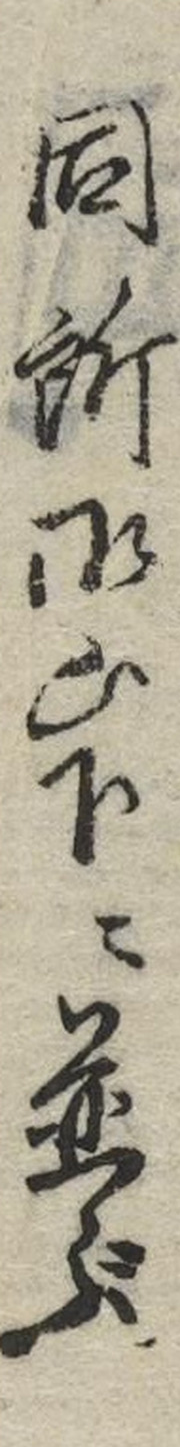同所御山下ニ並ぶ
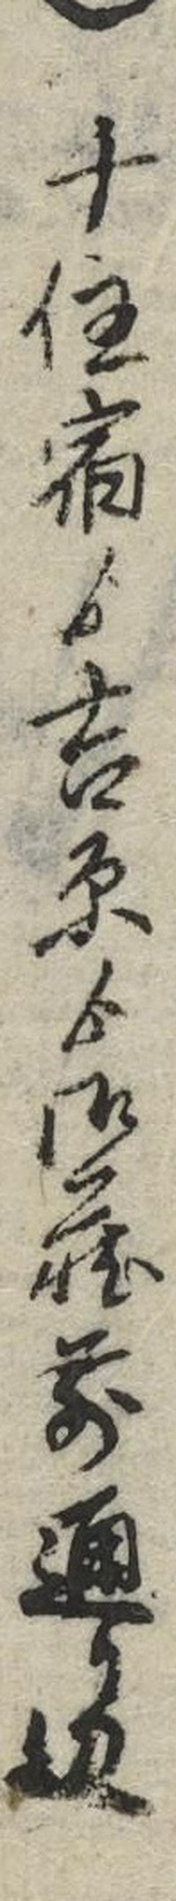一千住宿ゟ吉原ゟ御蔵前通り辺
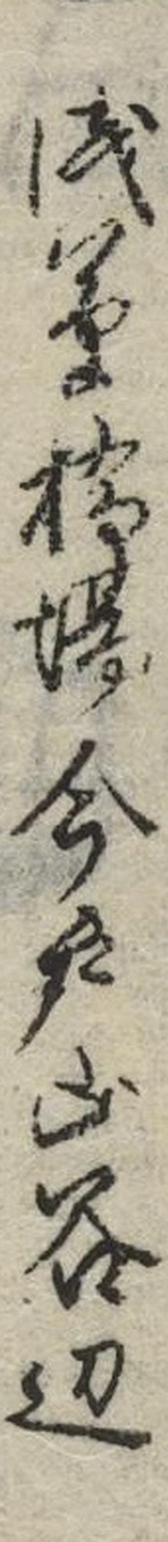二浅草橋場今戸山谷辺
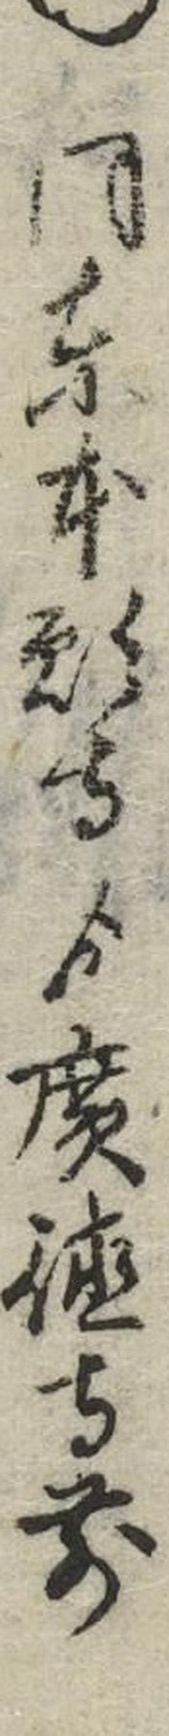三同東本願寺ゟ廣徳寺前
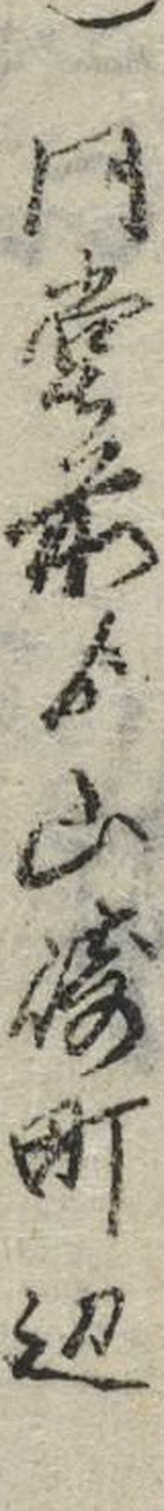四同堂前ゟ山崎町辺
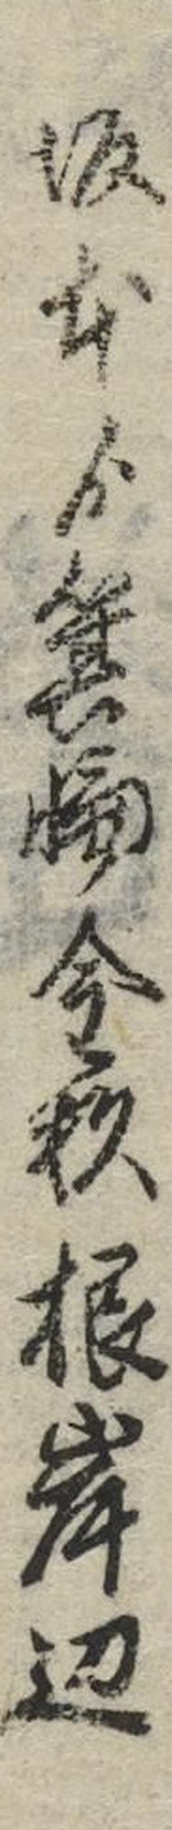五坂本ゟ箕輪今杉根岸辺
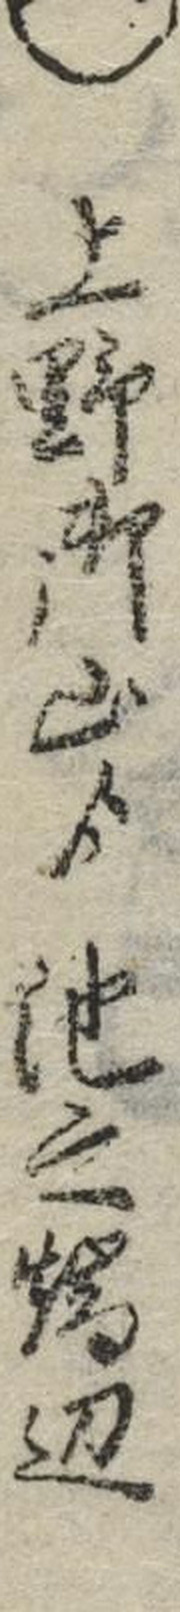六上野御山ゟ池之端辺
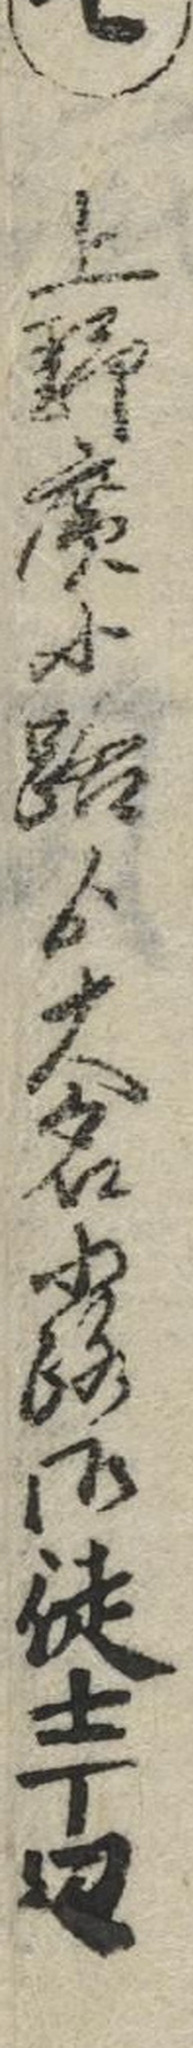七上野広小路ゟ大名小路御徒士丁辺
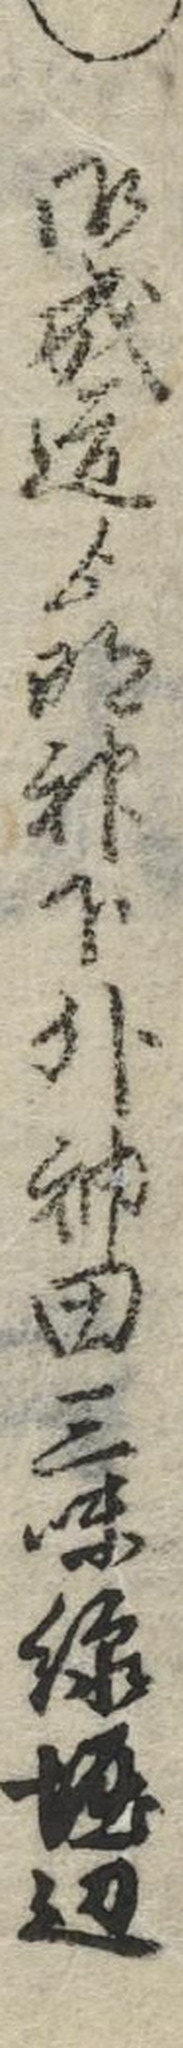八御成道ゟ明神下外神田三味線坂辺
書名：江戸御屋鋪方町方共　地震類焼場所巨細書之寫　潰家潰土蔵共取調附街道筋近在迄
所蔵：東京大学地震研究所図書室 Earthquake Research Institute Library, The University of Tokyo, JAPAN
